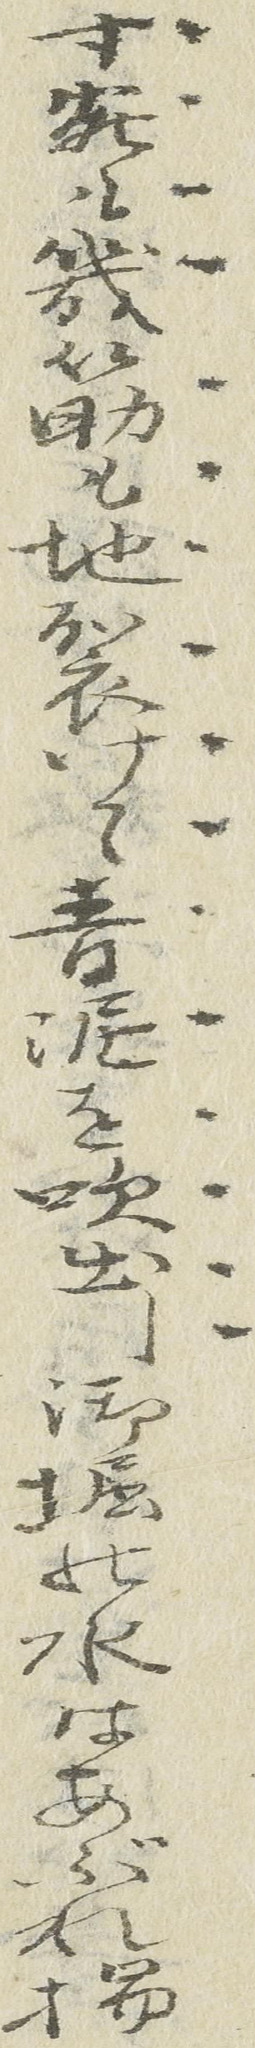寸宛も幾筋も地裂けて青泥を吹出し御堀のモズはあぶれ揚が
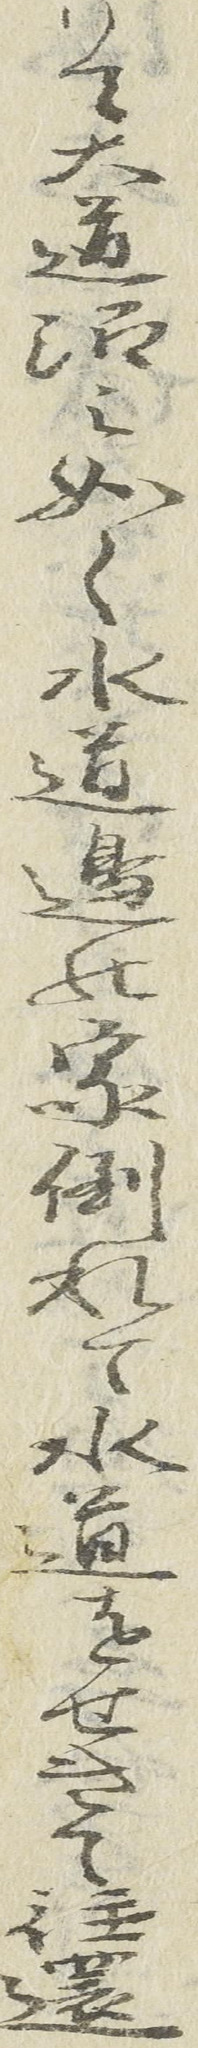りて大道沼之如く水道邊の家倒れて水道をせきて往還

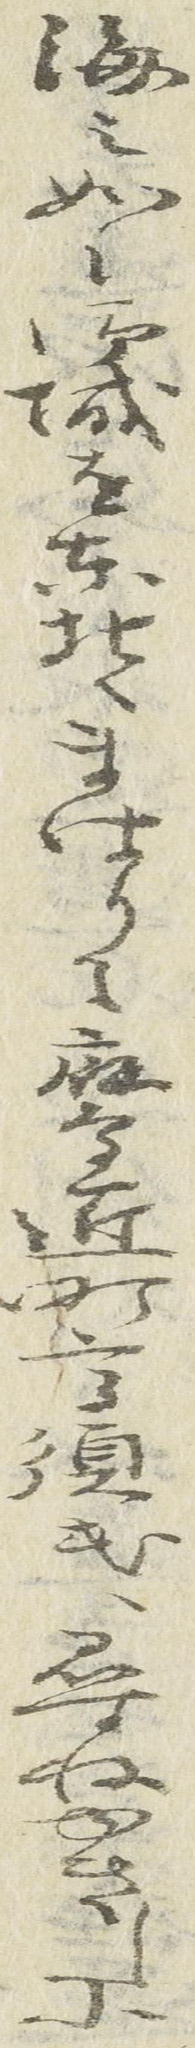海之如し御城を東北へまはりて鷹匠町高須出へ尋ねゆき所
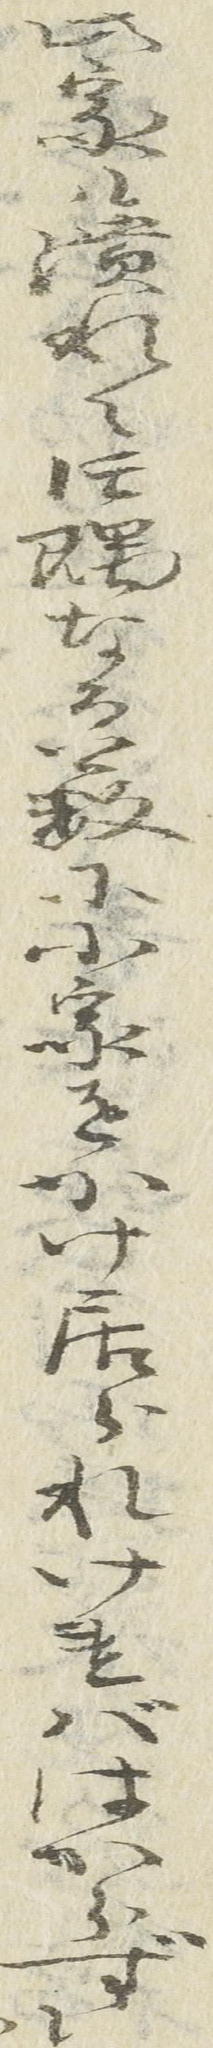此家も潰れて片隅なる薮に小家をかけ居られけれバはからずも
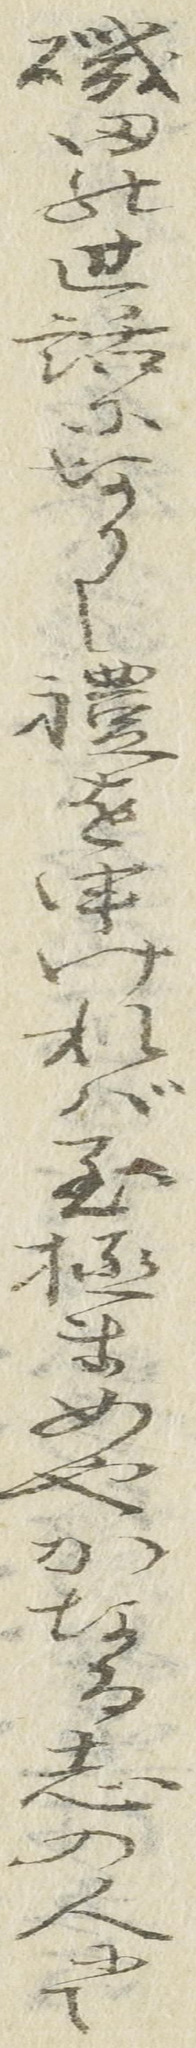磯田の世話になりて禮を申けれバ至極まめやかなる志の人にて
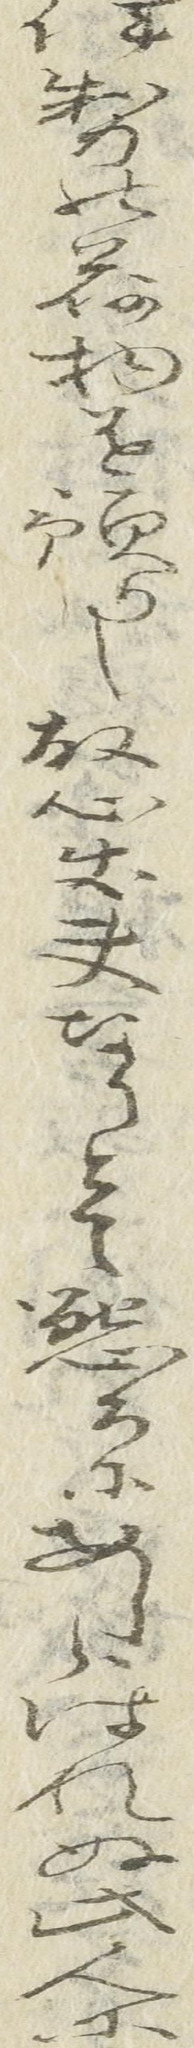伊勢の荷物を預りし故心丈夫なりとて懇ろにあしらはれぬ此人に
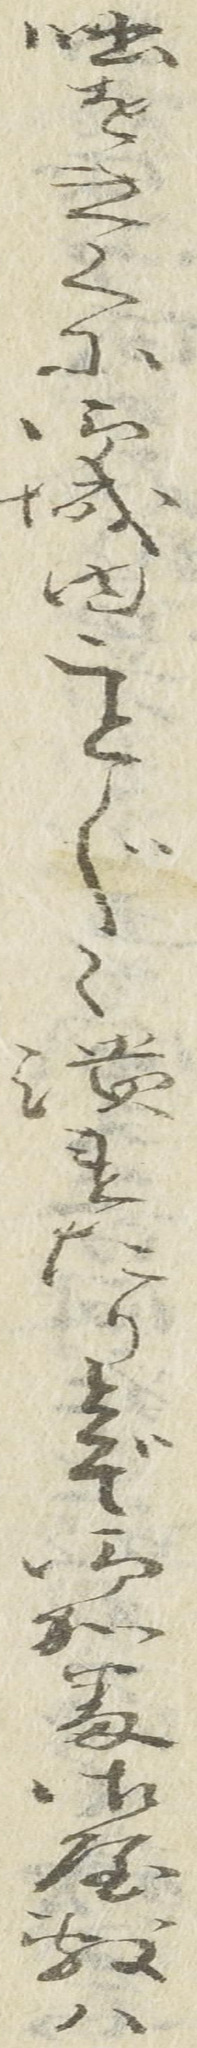咄をきくに御城内こと〴〵く潰れたりとぞ御加番御屋敷ハ
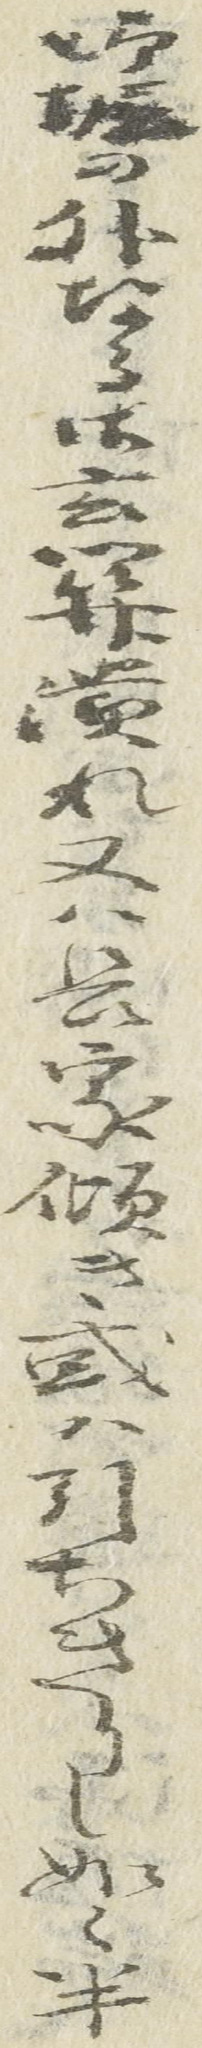御堀の外なるは玄關潰れ又ハ長家傾き或ハ引ちきりし如く半
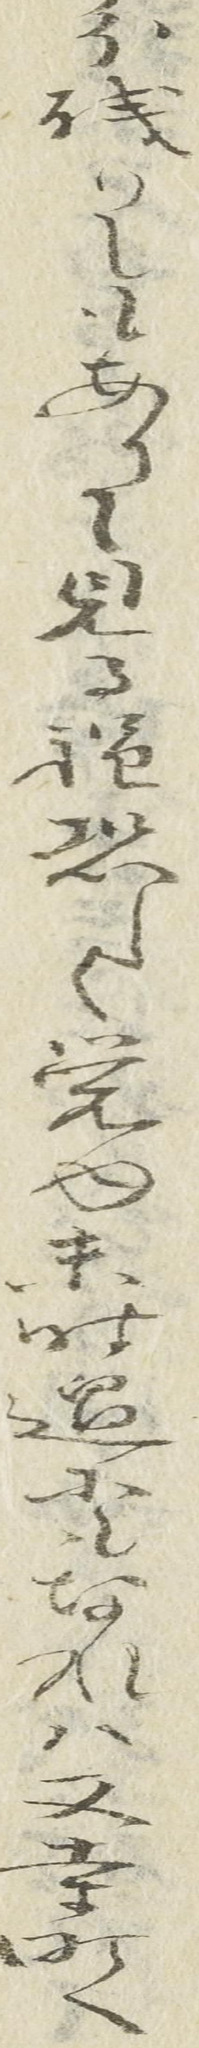分残りしもありて見る程恐しく覚ゆ未時過にもなれハ又幸町へ
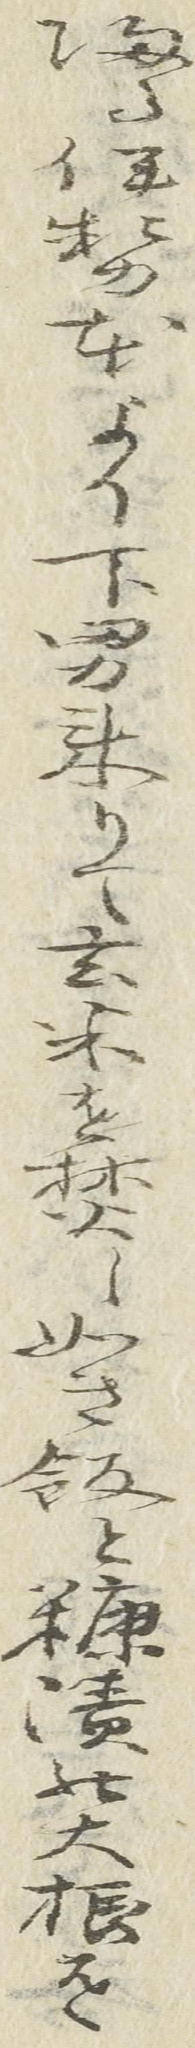帰る伊勢本より下男来りて玄米を焚し如き飯と糠漬の大根を
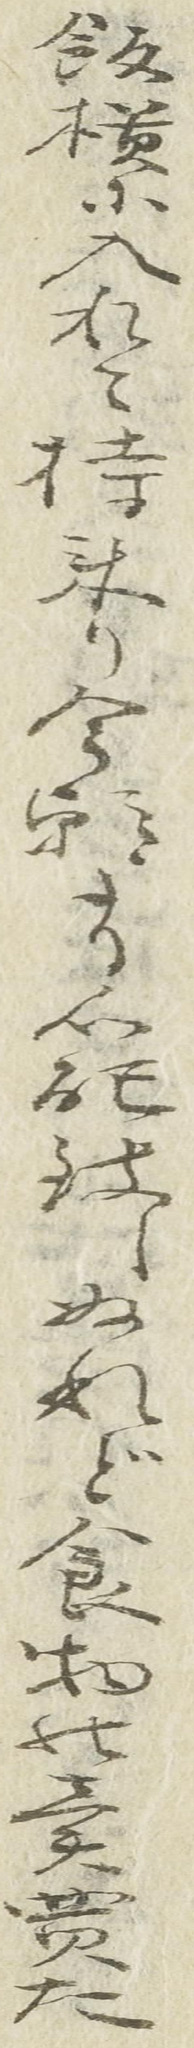飯横に入れて持ち来り今朝より心配致しぬれど食物の売買た
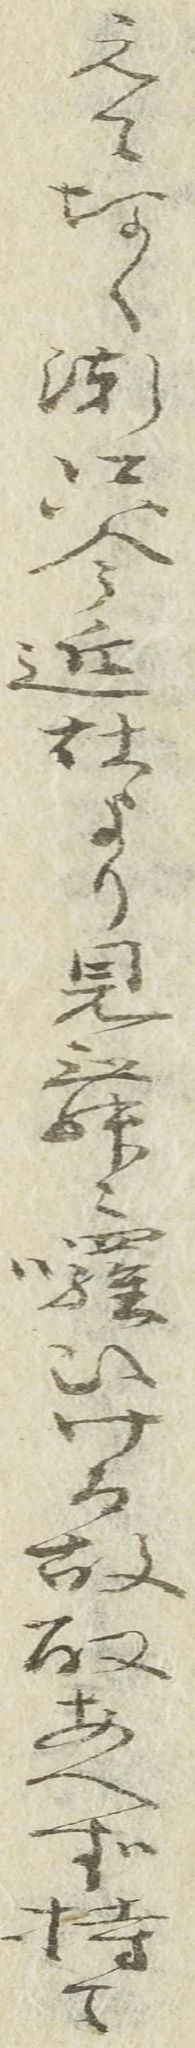えてなく漸只今近在より見舞ニ囉ひける故取あへず持て
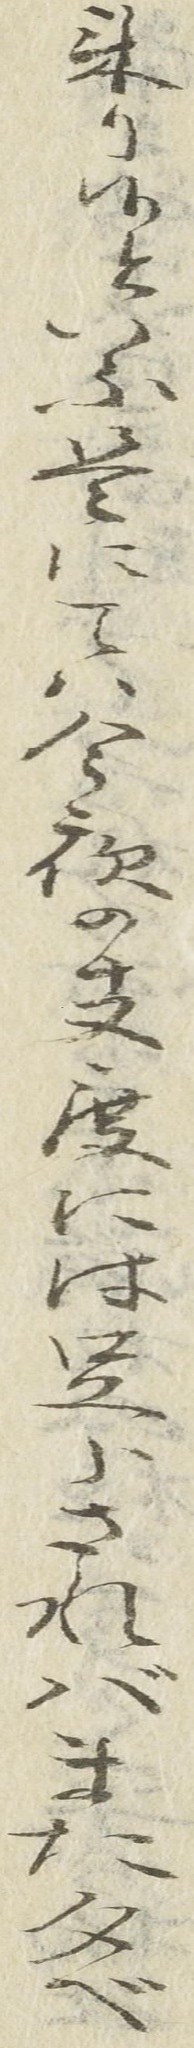来り候といふ是にてハ今夜の支度には足らされバまた夕べ
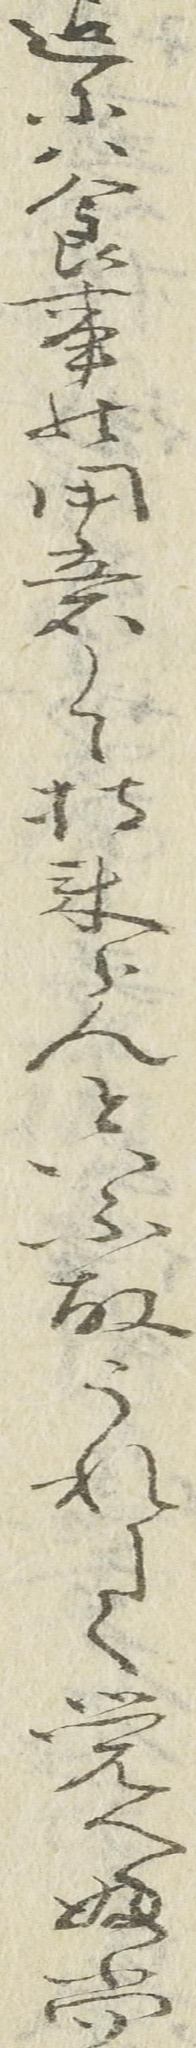迄には食事の用意して持来らんといふ故うれしく覚えぬ尚
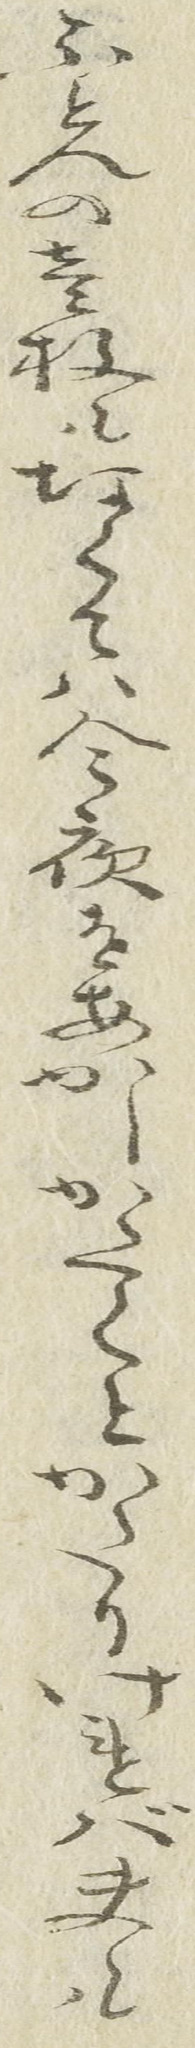ふとんの壱枚もなくてハ今夜をあかしかたくとかたりけれバ夫も
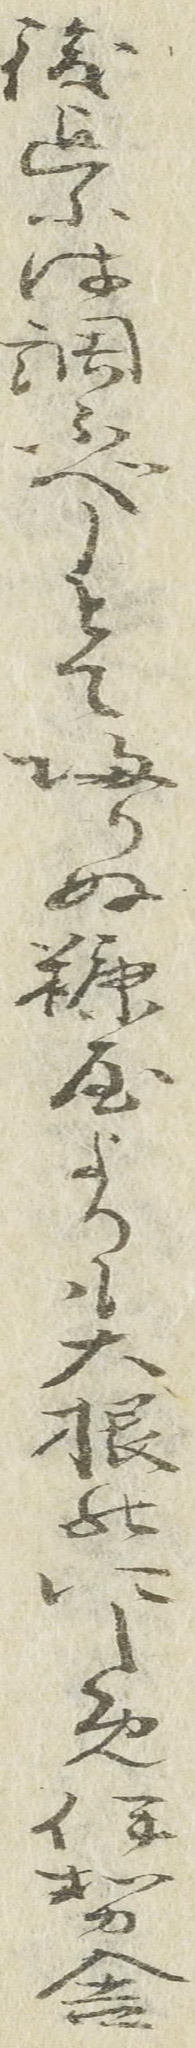後迄には調ふべしとて帰りぬ糠屋よりも大根のにしめ伊勢舎
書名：地震前兆集　全
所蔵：東京大学地震研究所図書室 Earthquake Research Institute Library, The University of Tokyo, JAPAN
